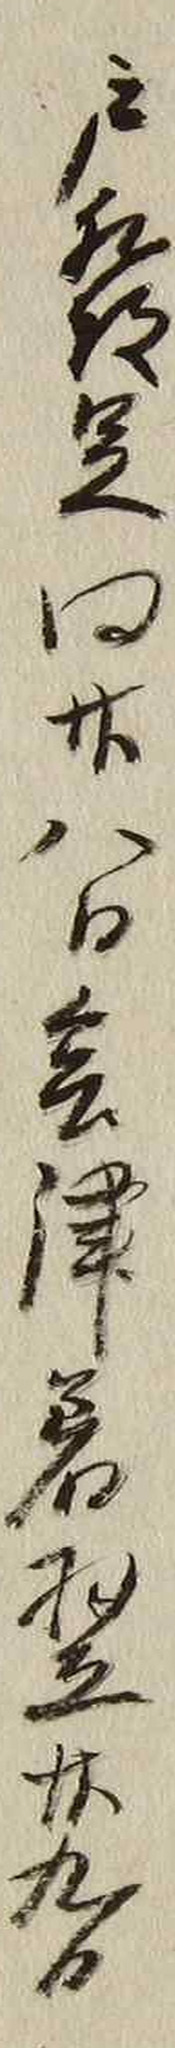戸発足同廿八日会津着翌廿九日
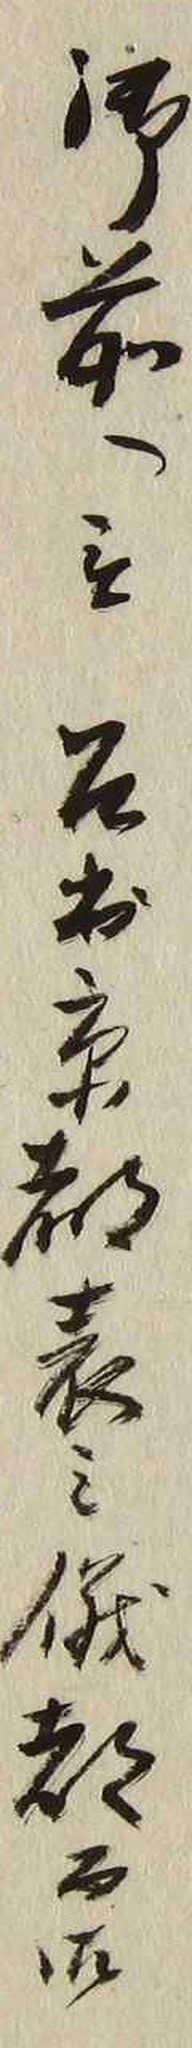御前へ被召出京都表之儀都而御
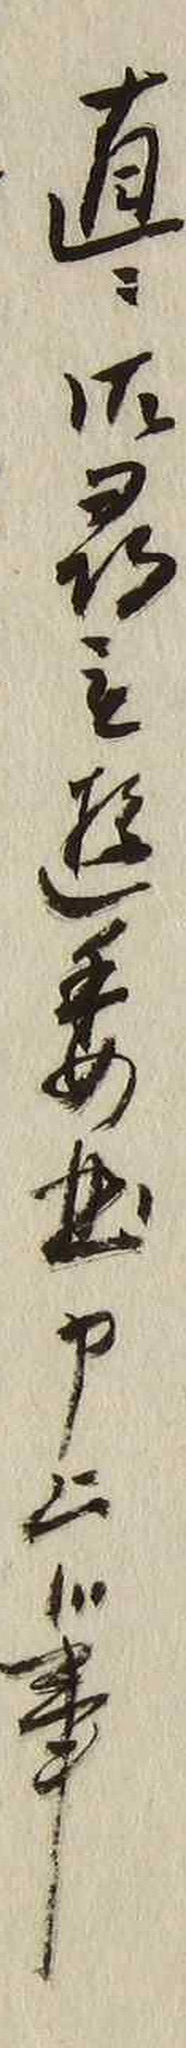直ニ御尋被遊委曲申上候事
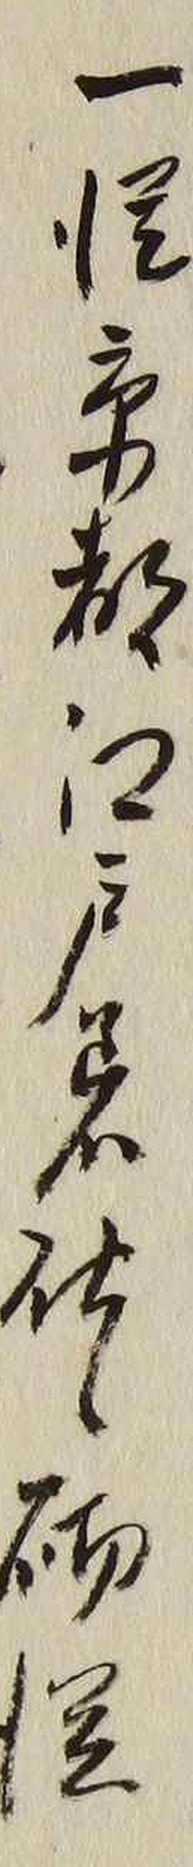一従京都江戸着仕候砌従
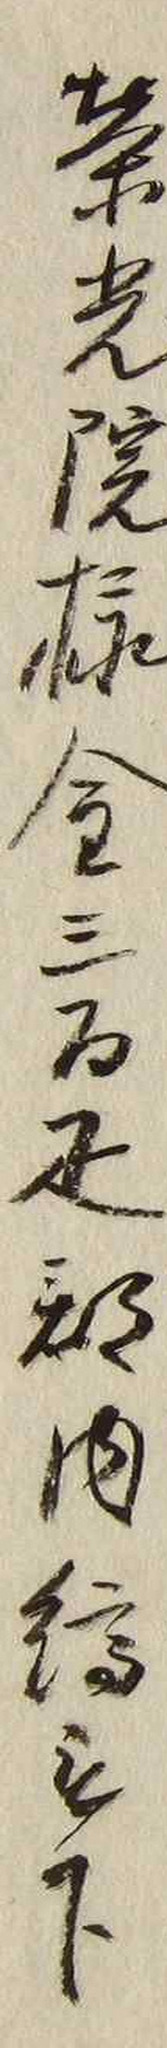栄光院様金三百疋郡内縞被下

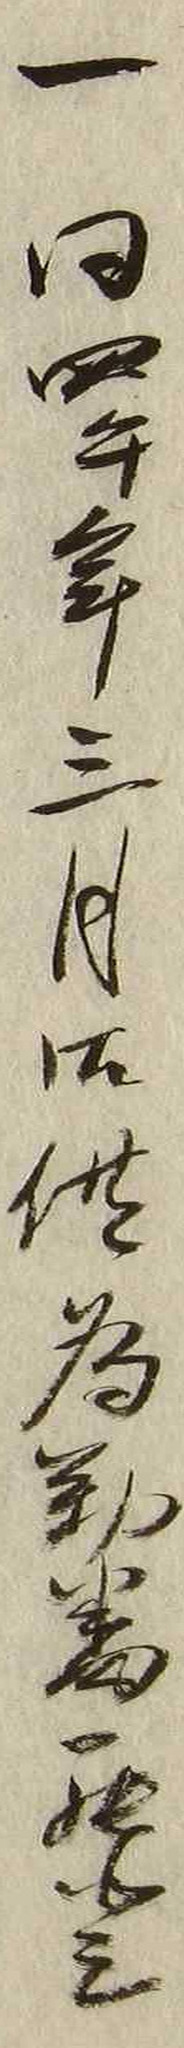一同四午年三月御供為勤番罷登
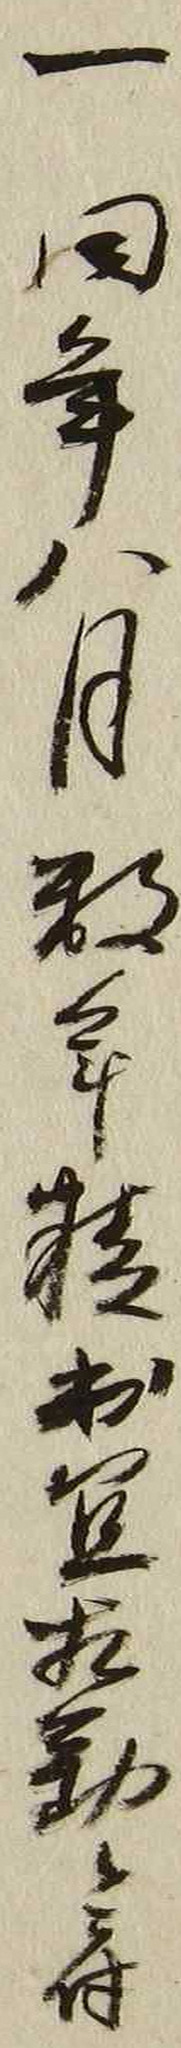一同年八月数年精出宜相勤候ニ付
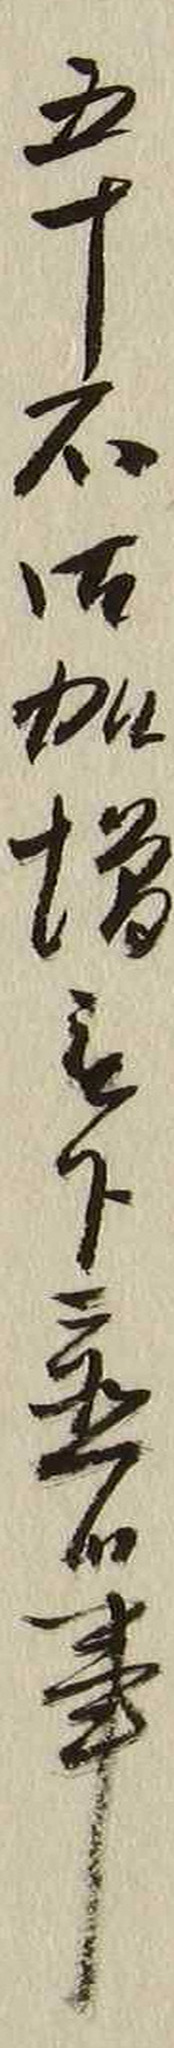五十石御加増被下置候事
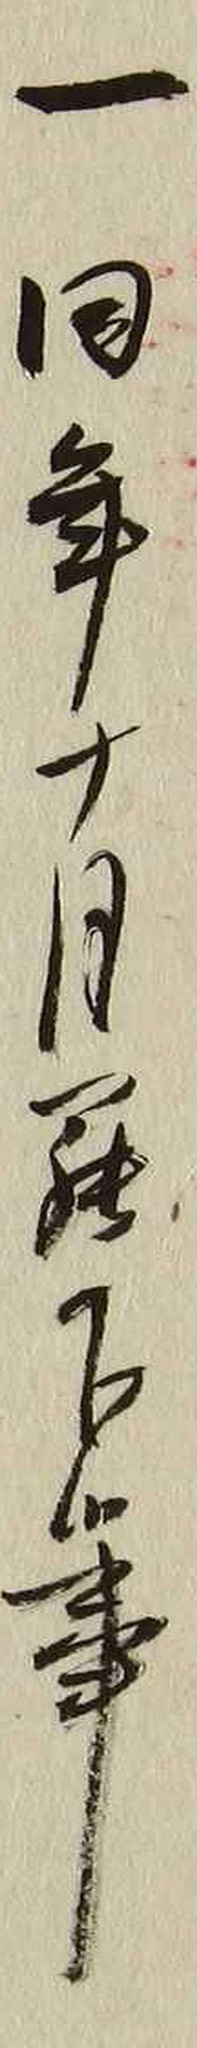一同年十月罷下候事
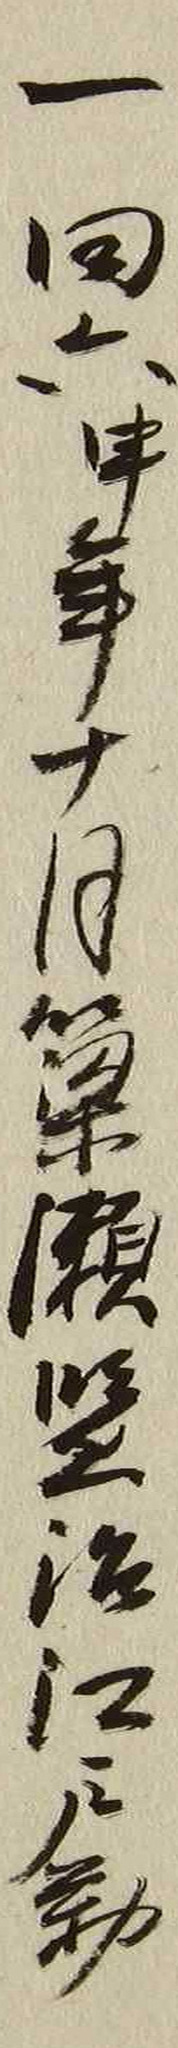一同六申年十月簗瀬監治江戸勤
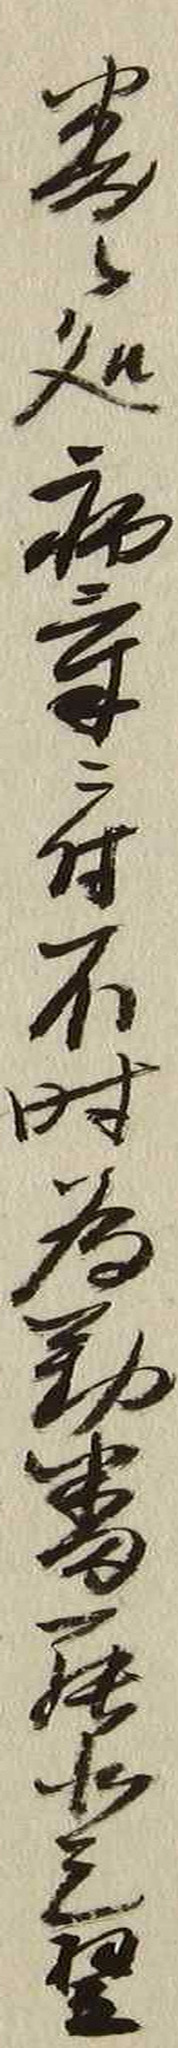番之処病気ニ付不時為勤番罷登翌
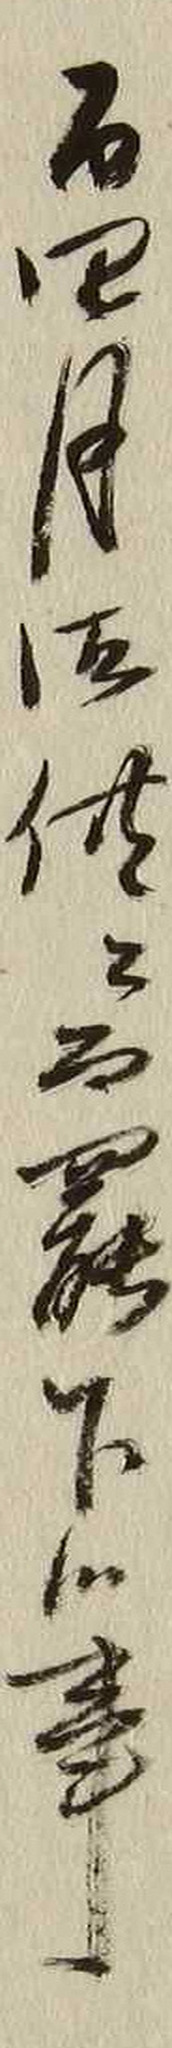酉四月御供ニ而罷下候事
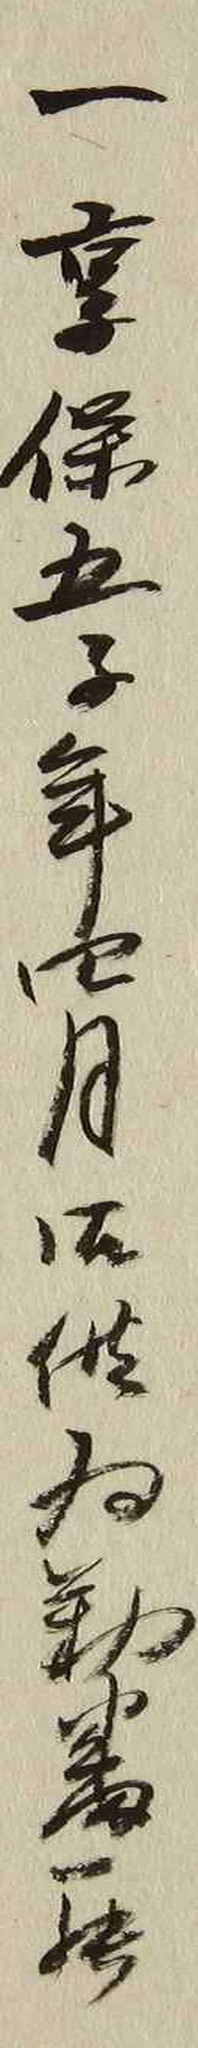一享保五子年四月御供為勤番罷
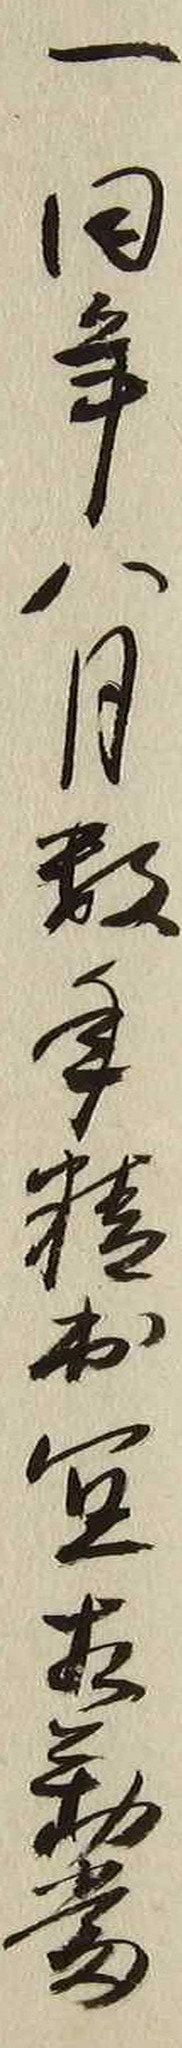一同年八月数年精出宜相勤当
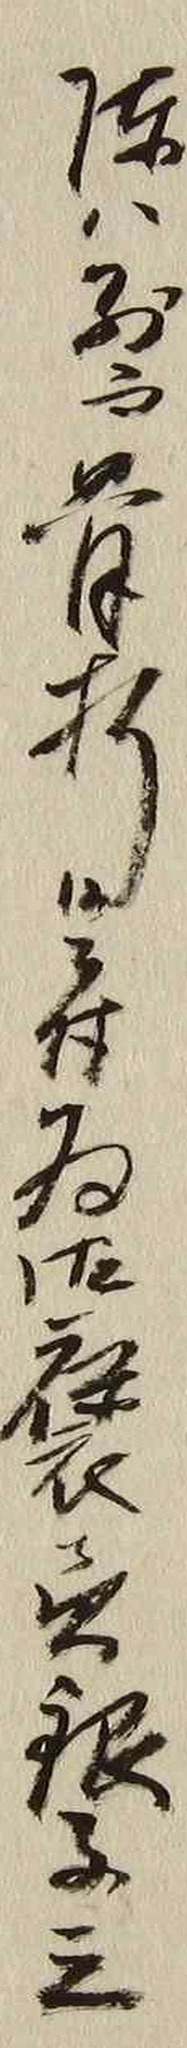陣ハ別而骨折候ニ付為御褒美銀子三
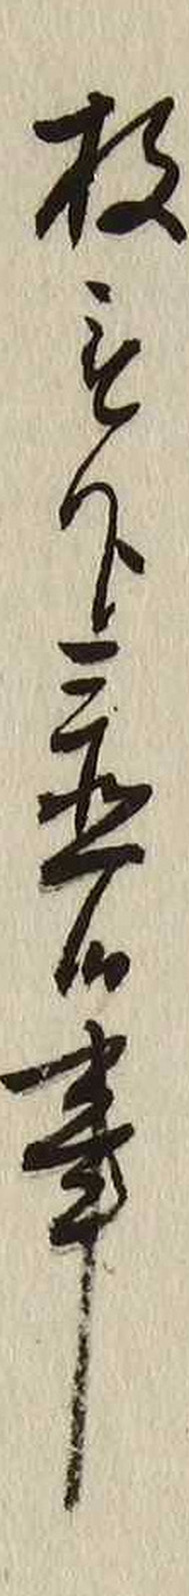枚被下置候事
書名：諸士系譜　巻之346　も之部2
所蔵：会津若松市立会津図書館
